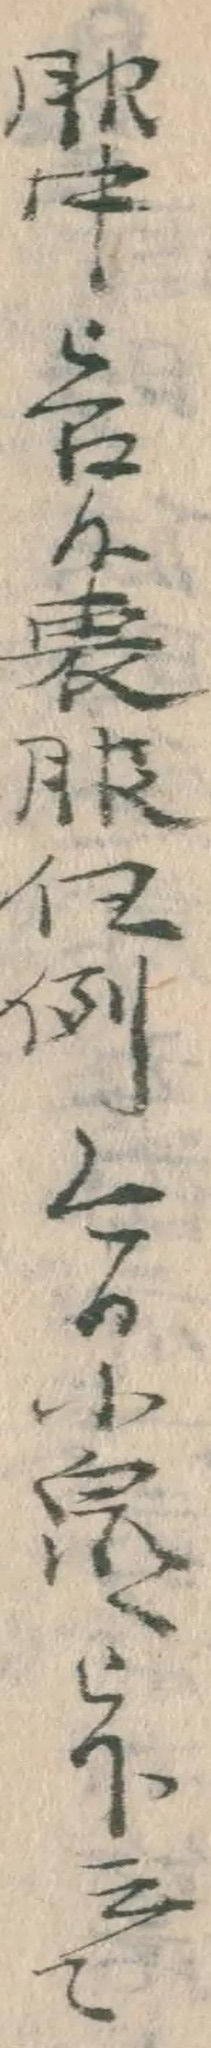服中被召候喪服任例今日小泉へ被下云々
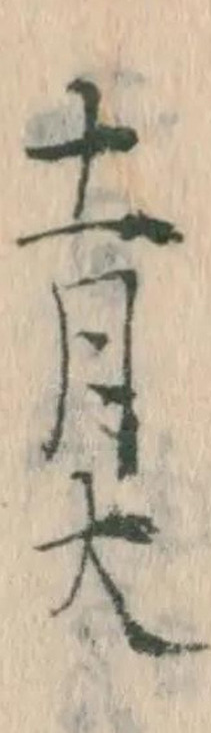十一月大
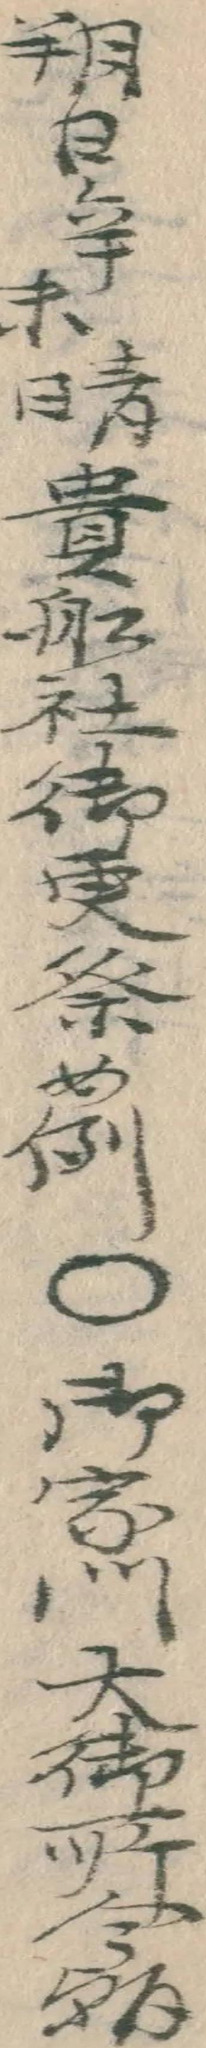朔日辛未晴貴船社御更祭如例○御家門大御所今朝
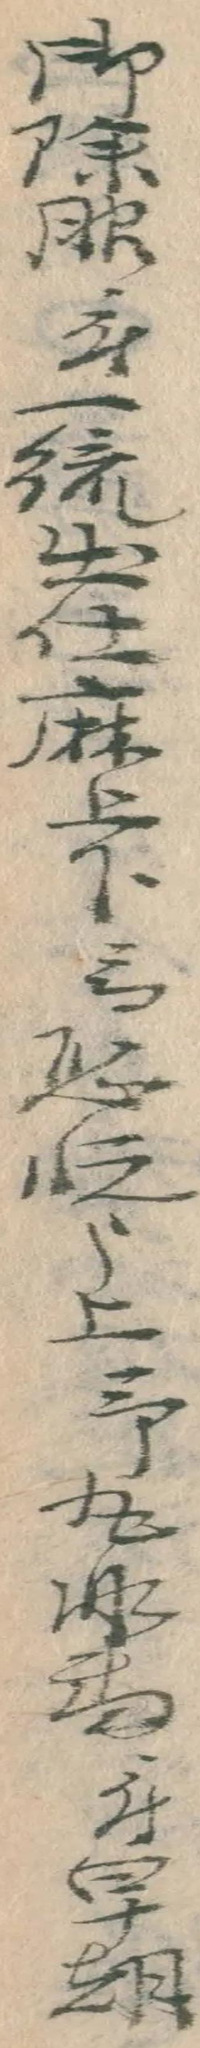御除服ニ付一統出仕麻上下ニ而恐悦申上予丸非番ニ付早朝

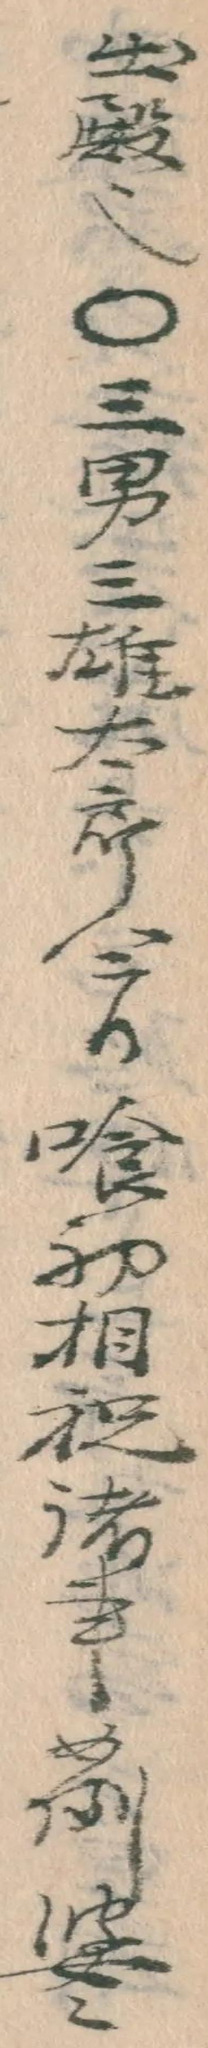出殿也○三男三雄太郎今日喰初相祝諸事如例婆
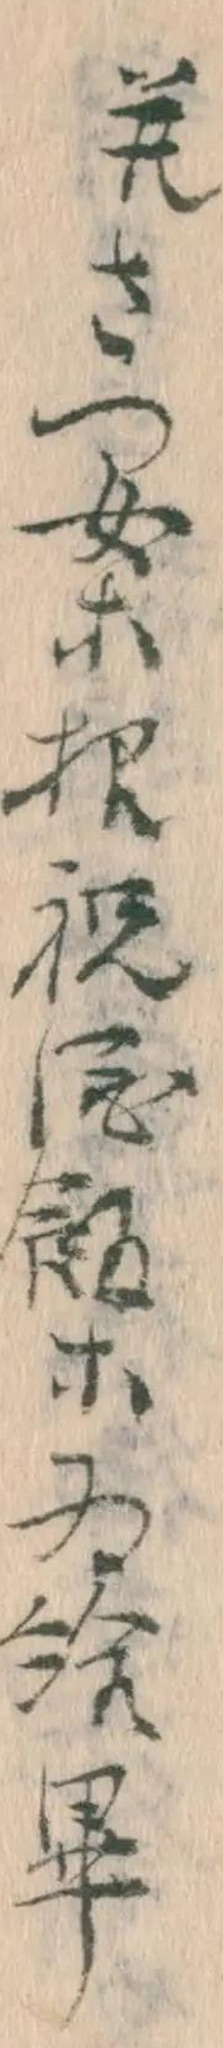幷さつ女等招祝同飯等為給畢
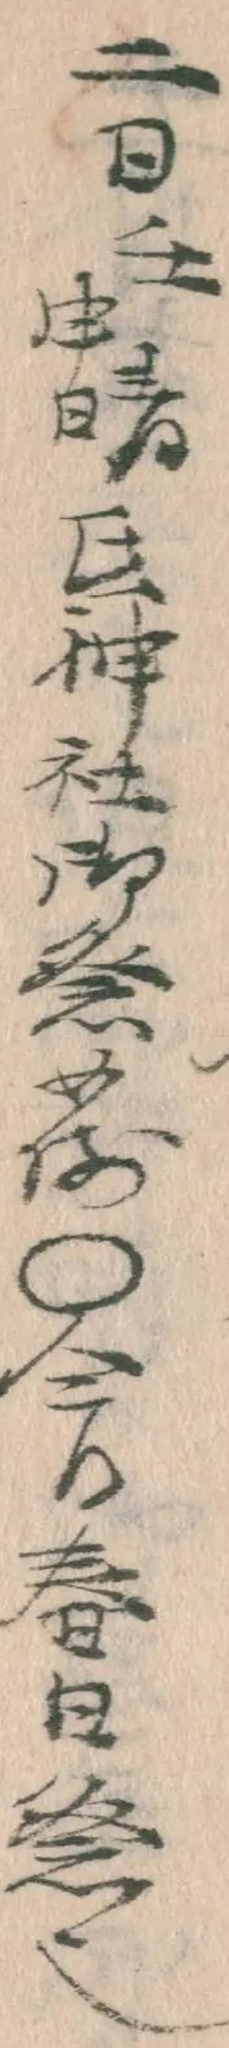二日壬申晴氏神社御祭如例〇今日春日祭也
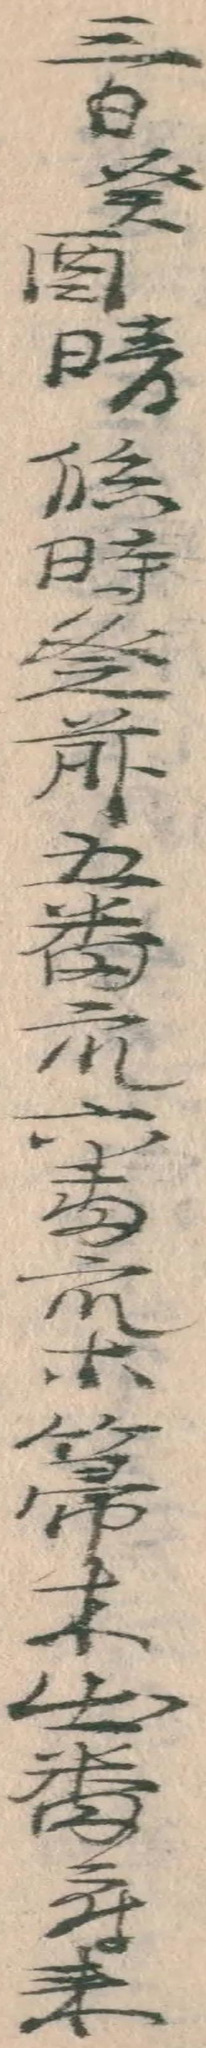三日癸酉晴臨時祭前五番衆六番衆等箒木出番ニ付参
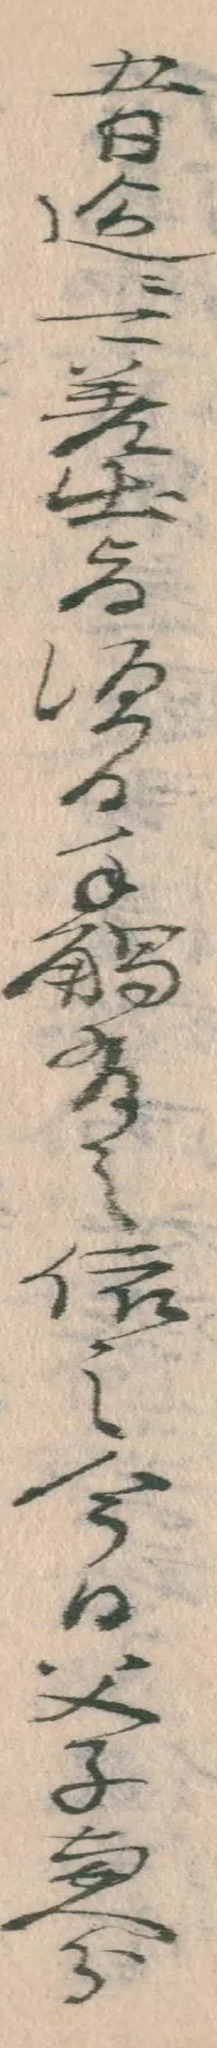五日迄ニ可差出旨頃日手触有之依之今日父子両人分
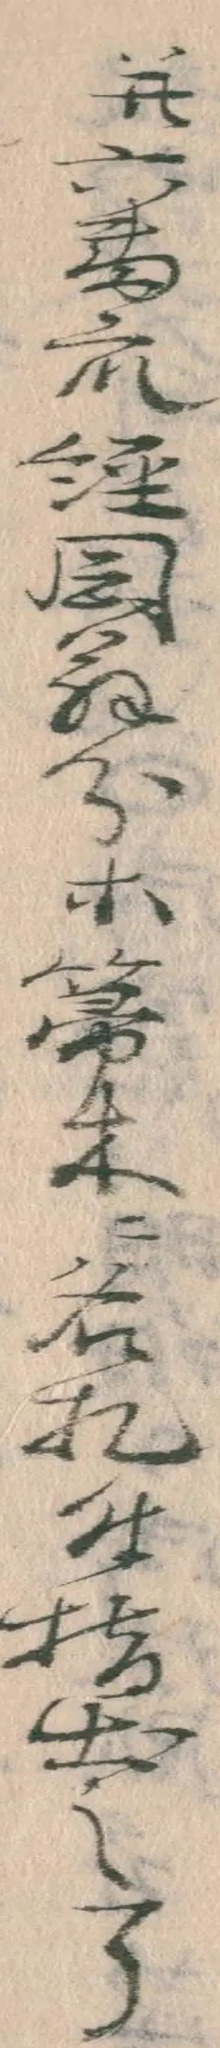并六番衆経岡翁分等箒木ニ名札付指出之了
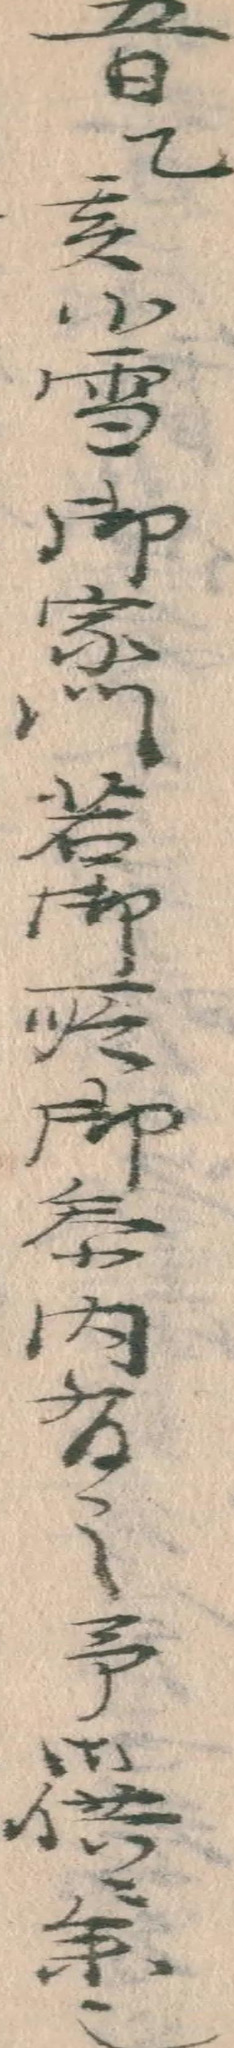五日乙亥小雪御家門若御所御参内有之予御供に参也
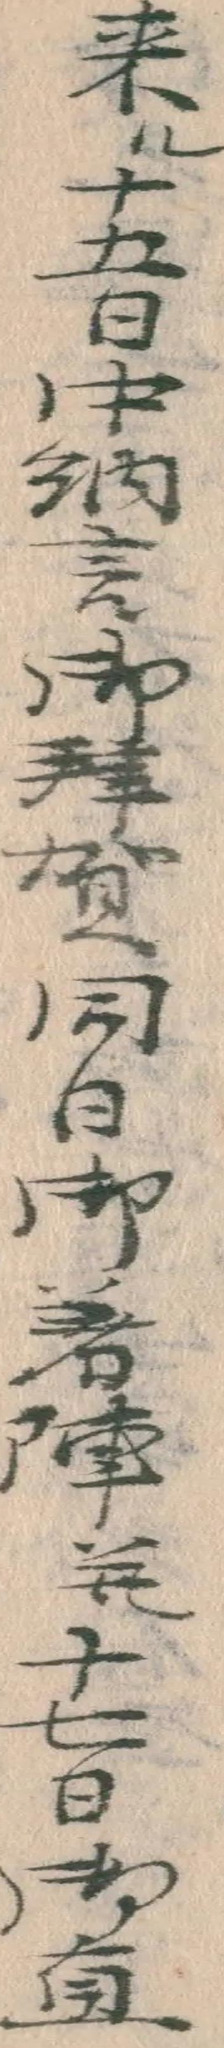来ル十五日中納言御拝賀同日御着陣并十七日御直
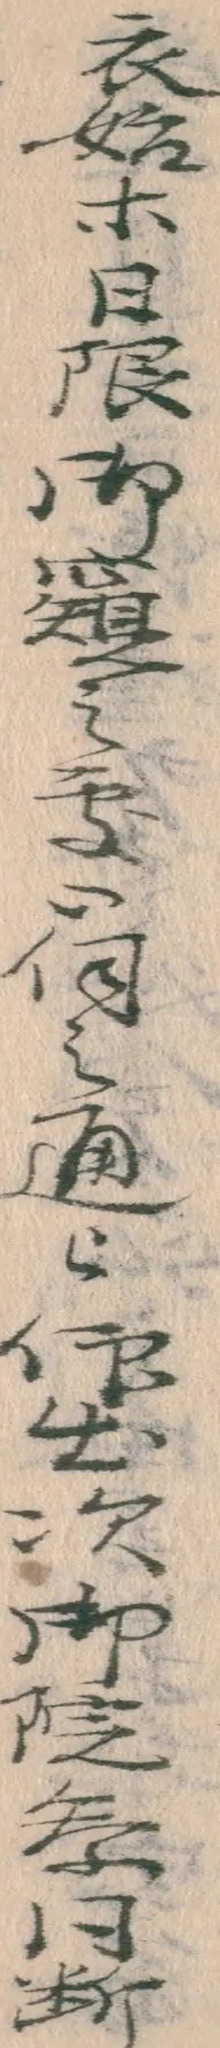衣始等日限御窺之處御伺之通被仰出次御院参同断
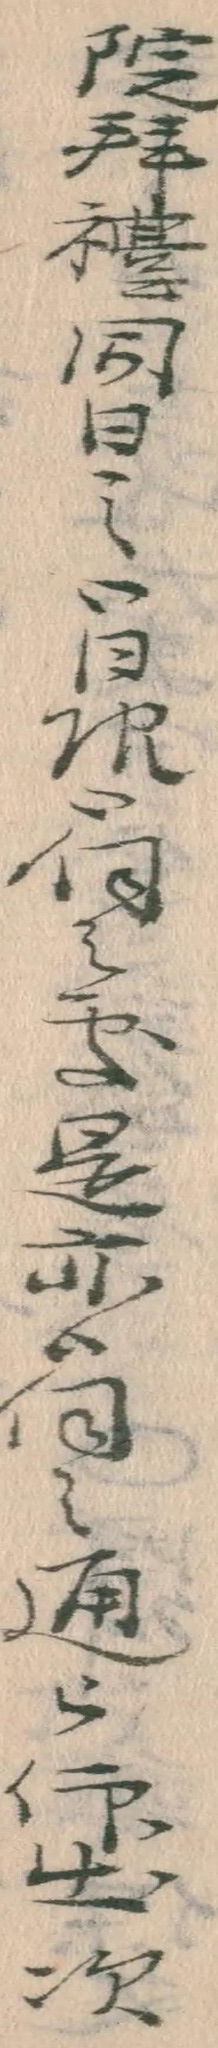院拝禮同日之御日限御伺之處是亦御伺之通被仰出次
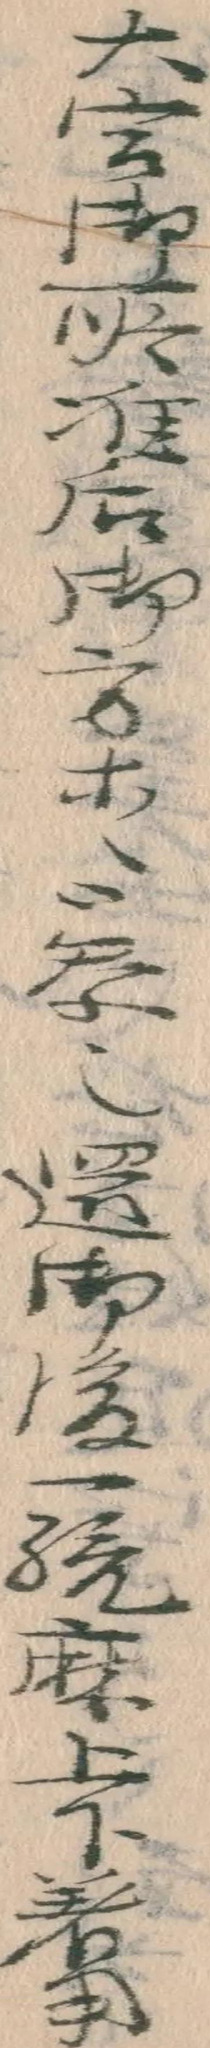大宮御所准后御方等へ御祭也還御後一統麻上下着用
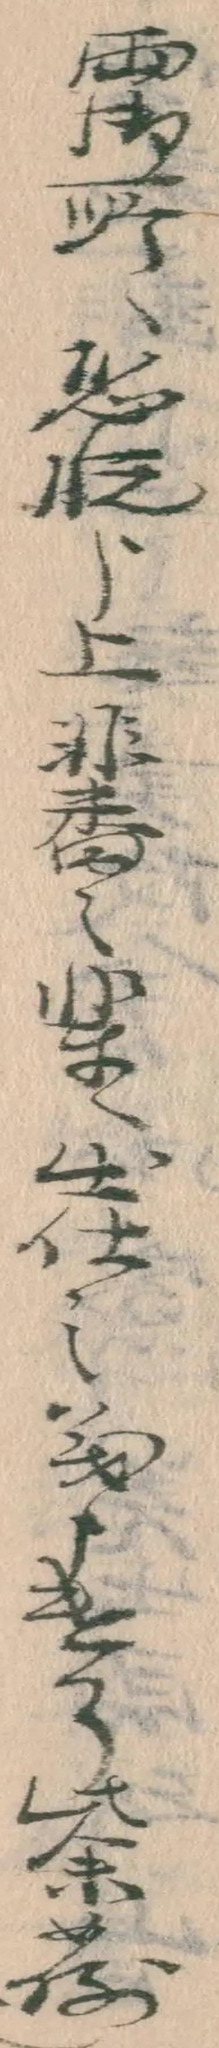両御所へ恐悦申上非番之輩へ出仕之義申遣了此余如例
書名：賀茂社記録. 第63冊
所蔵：国立国会図書館 National Diet Library, JAPAN
